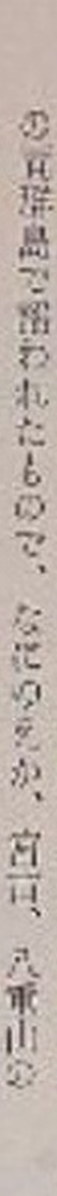の両群島で謡われたもので、なにゆえか、宮古、八重山の
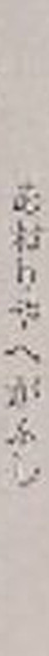あおりやへがふし
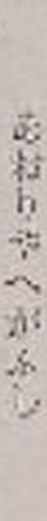あおりやへがふし
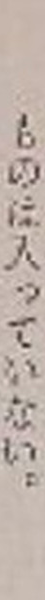ものは入っていない。
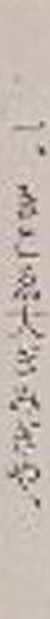一、きこゑ大ぎみぎや、
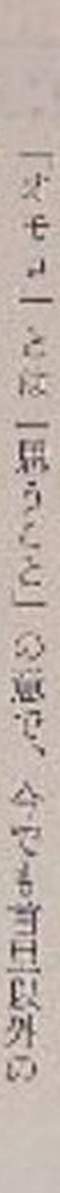「オモロ」とは「思うこと」の意で、今でも首里以外の
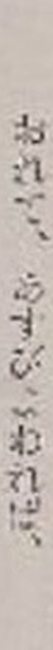おれて、あすびよわれば、
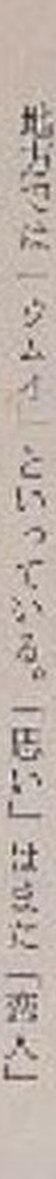地方では「ウムイ」といっている。「思い」はまた「恋人」
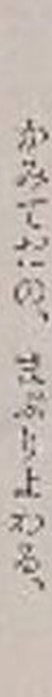かみてだの、まぶりよわる、
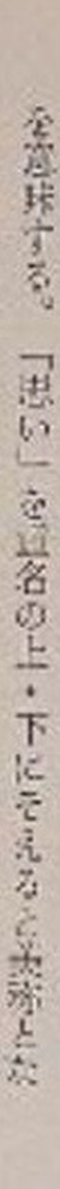を意味する。「思い」を通名の上・下にそえると美称とな
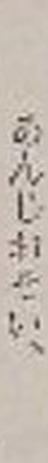あんじおそい、
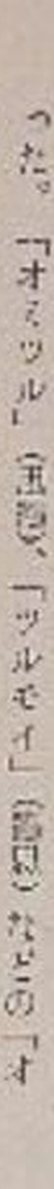った。「オミツル」(思)、「ツルモイ」(思)などの「オ
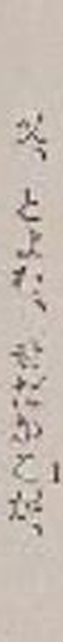又、とよむ、せだかこが、
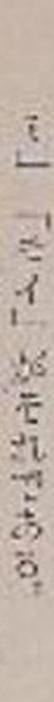ミ」「モイ」がそれである。
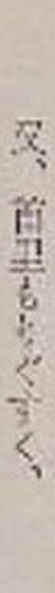又、首里もりぐすく、
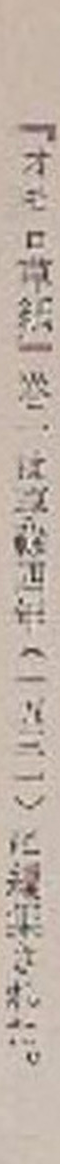『オモロ草紙』巻一は享禄四年(一五三一)に編集された。
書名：沖縄口承文芸
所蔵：University of the Ryukyus Library
